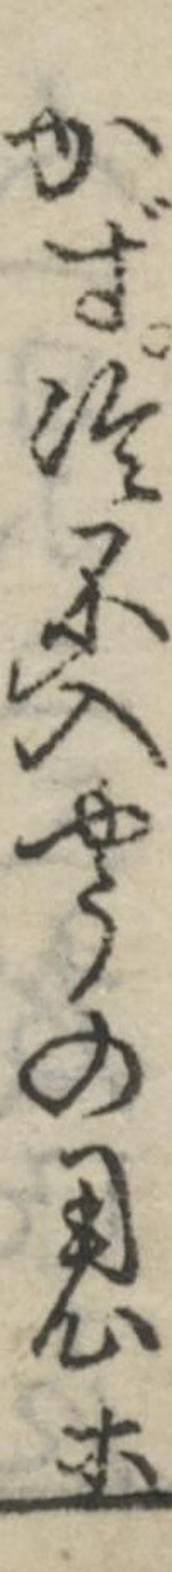かず。冷不入やうの用心等
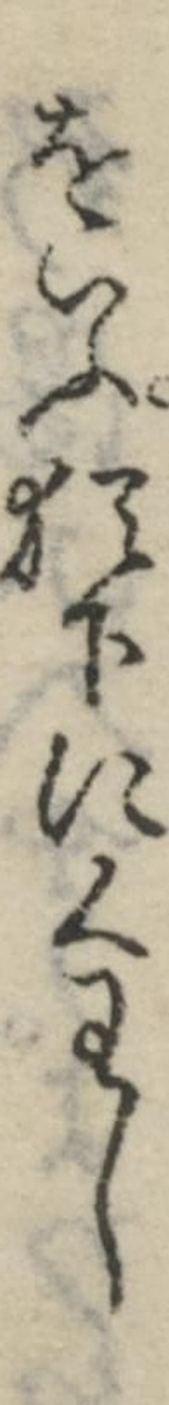をいふ。猶下にくわし
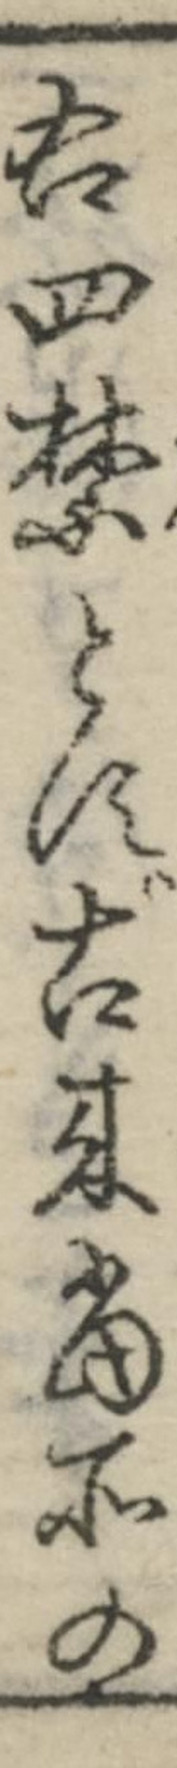右四禁とす。古来当所の
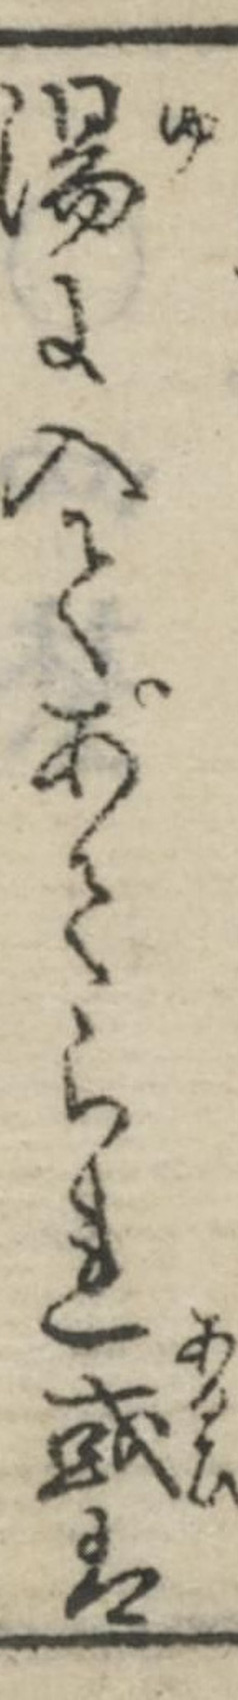湯に入て。あてられ或は
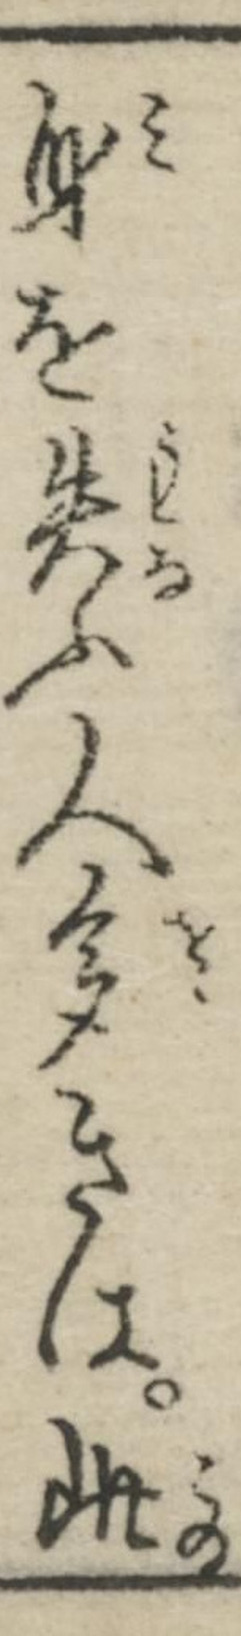身を失ふ人多きは。此
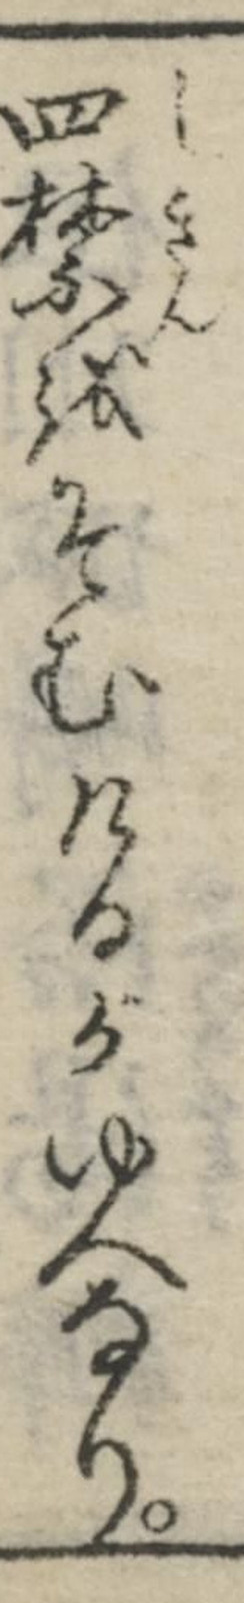四禁をそむけるがゆへなり。
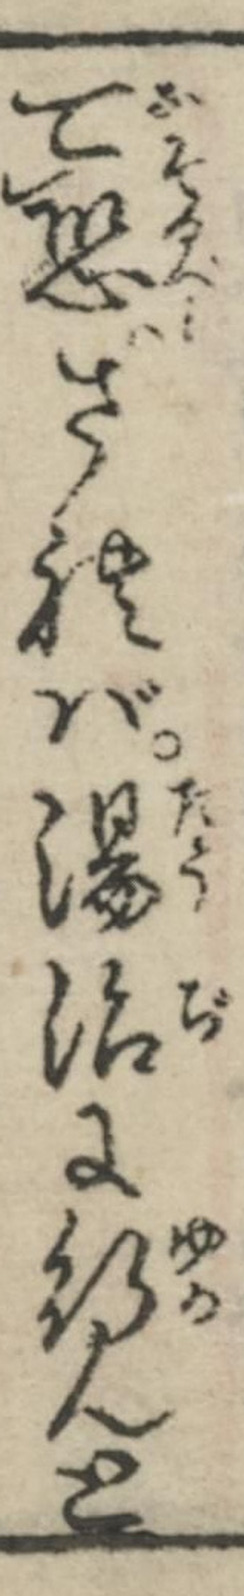可恐。されば。湯治に行んと
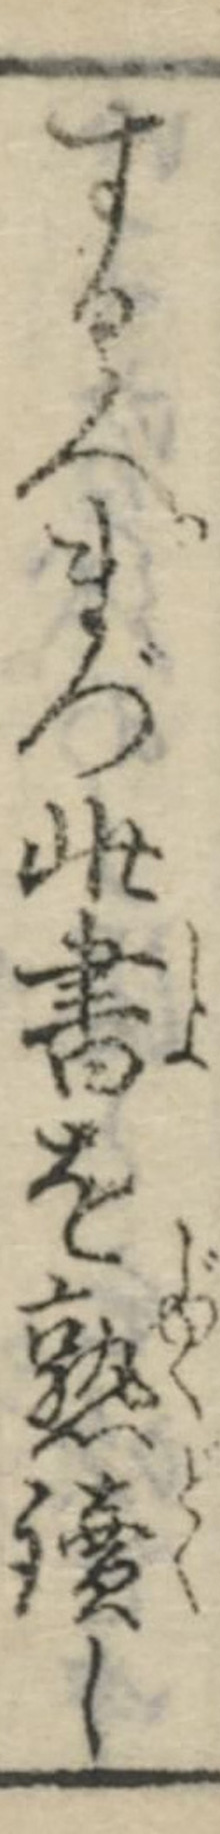する人。まづ此書を熟読し
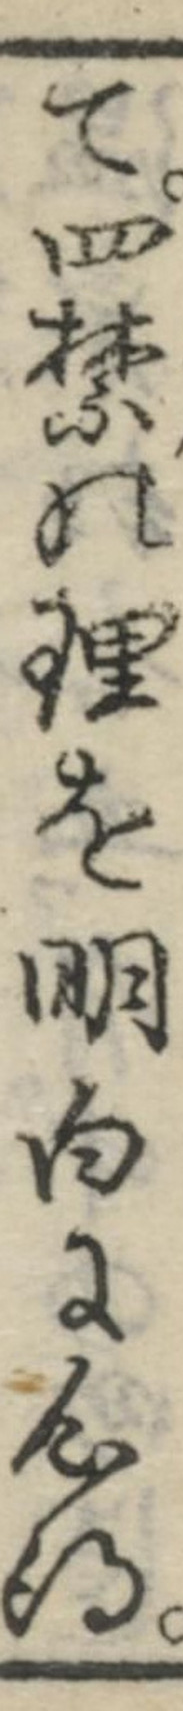て。四禁の理を明白に心得。
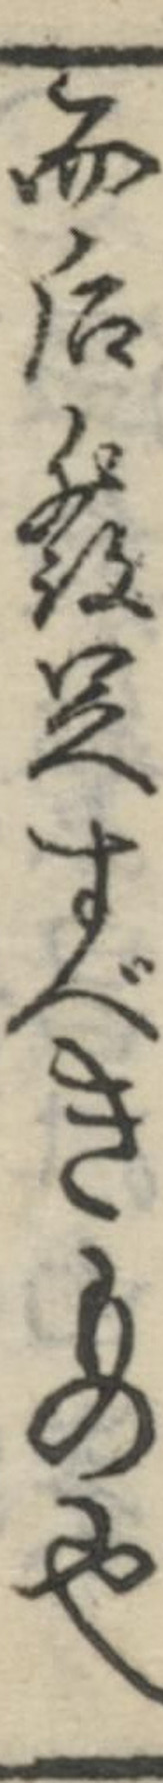而后発足すべきもの也
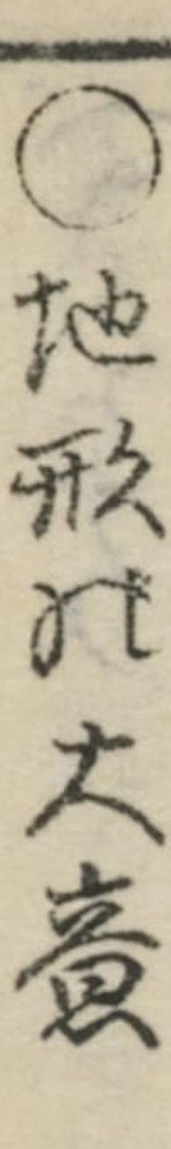○地形の大意
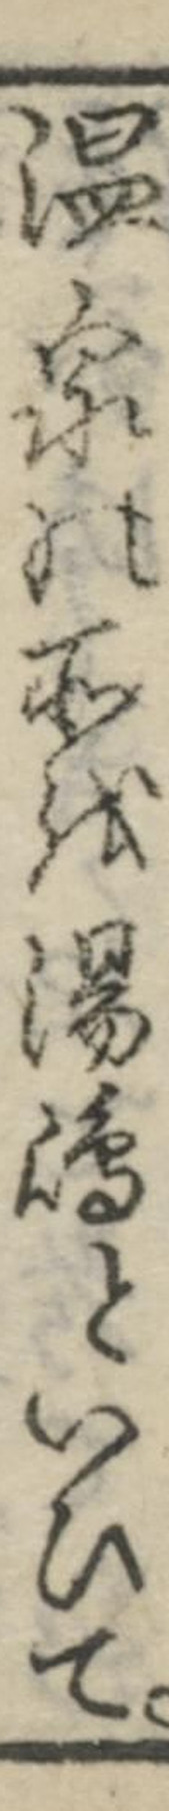温泉の所を湯島といひて。
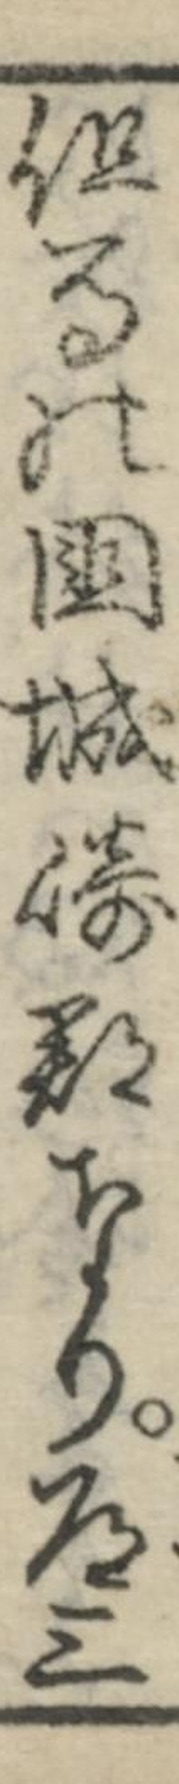但馬の国城崎郡なり。道三
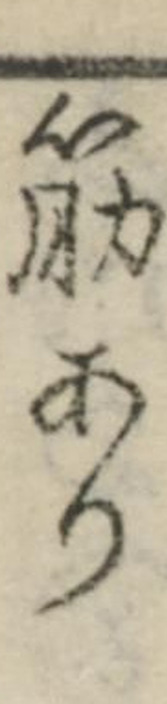筋あり
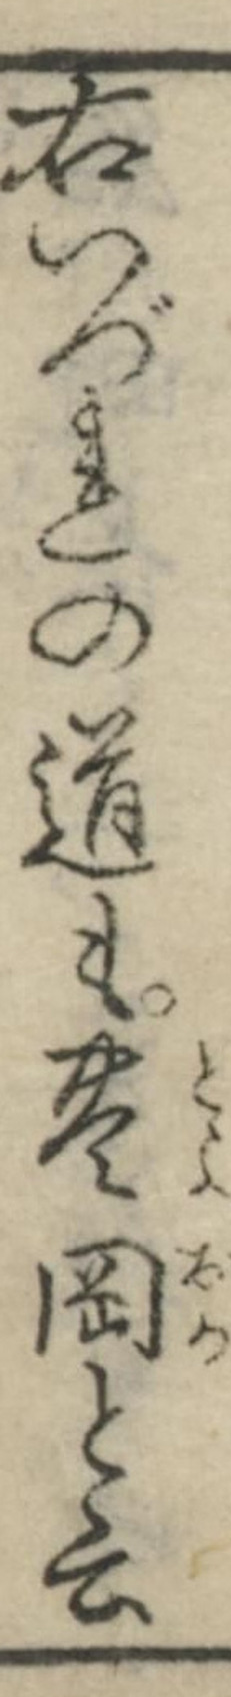右いづれの道も。豊岡と言
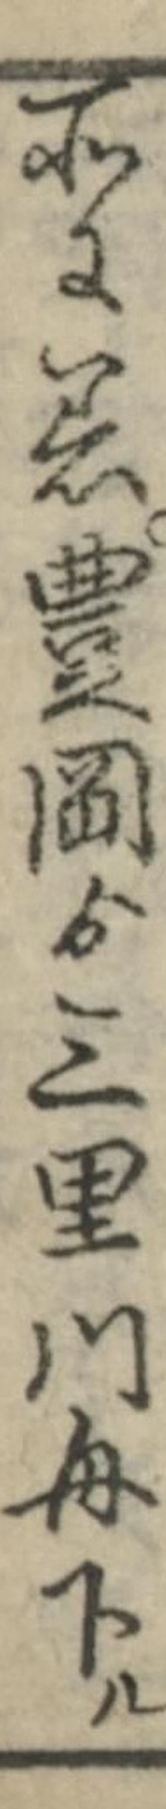所に着。豊岡ゟ三里川舟下る。
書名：但州城崎浴湯辧
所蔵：東京大学地震研究所図書室 Earthquake Research Institute Library, The University of Tokyo, JAPAN
